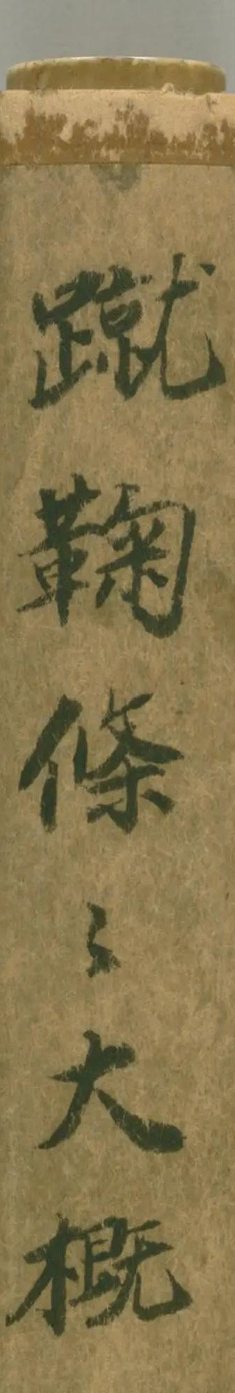蹴鞠條々大概

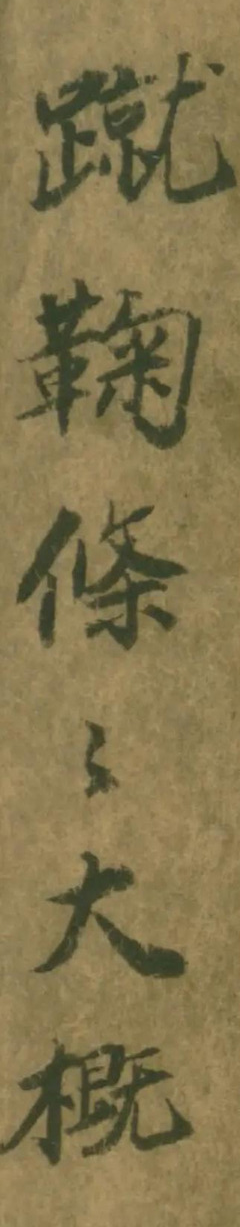蹴鞠條々大概

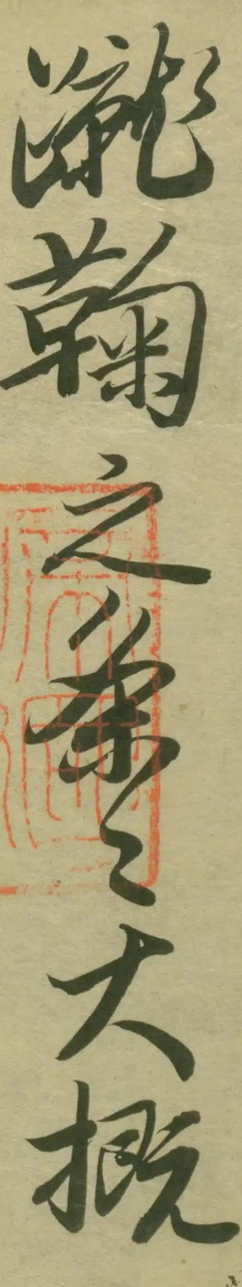蹴鞠之条々大概
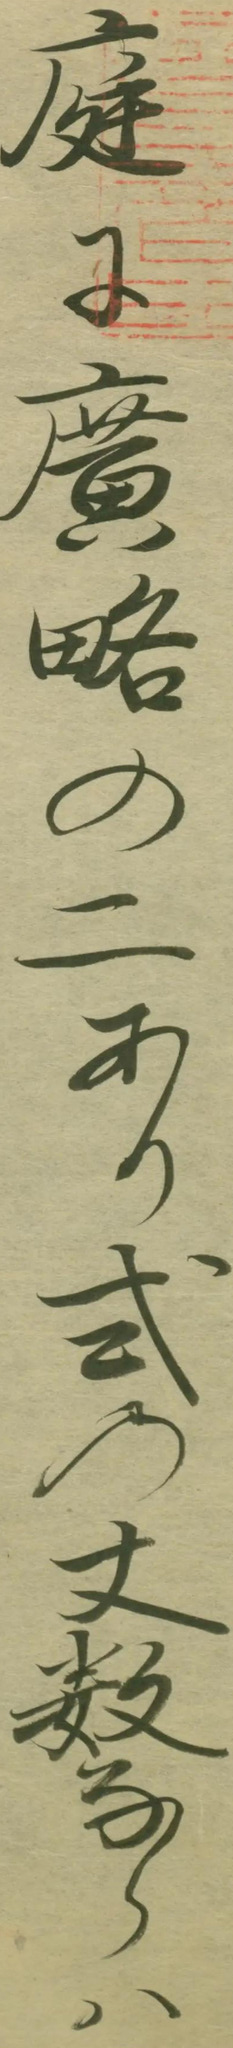庭に広略の二あり式の丈数ならは
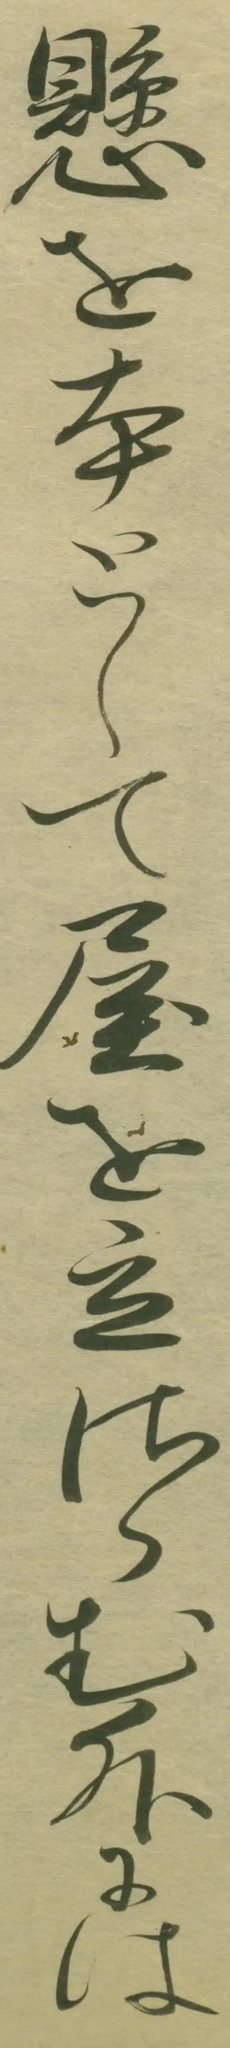懸を本として屋を立さらむ外には
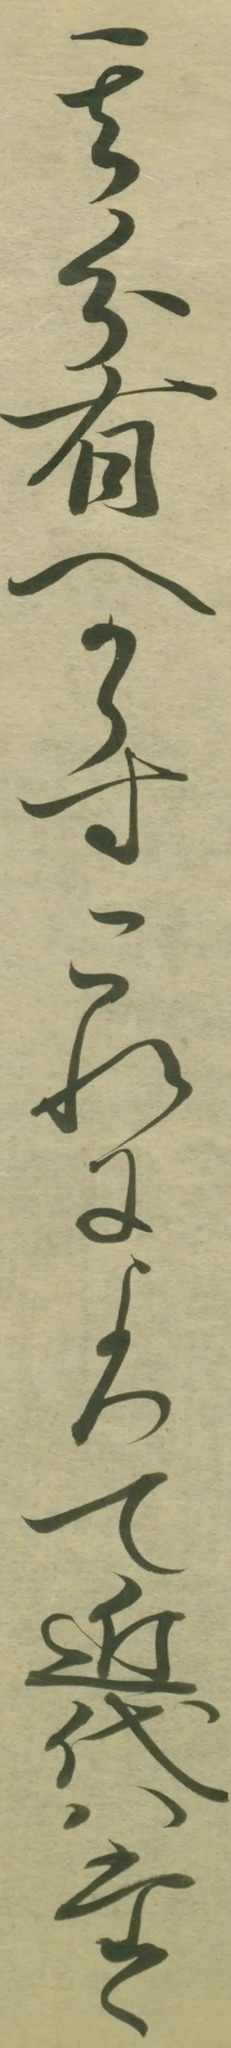其分有へからすこれによつて近代はたゝ
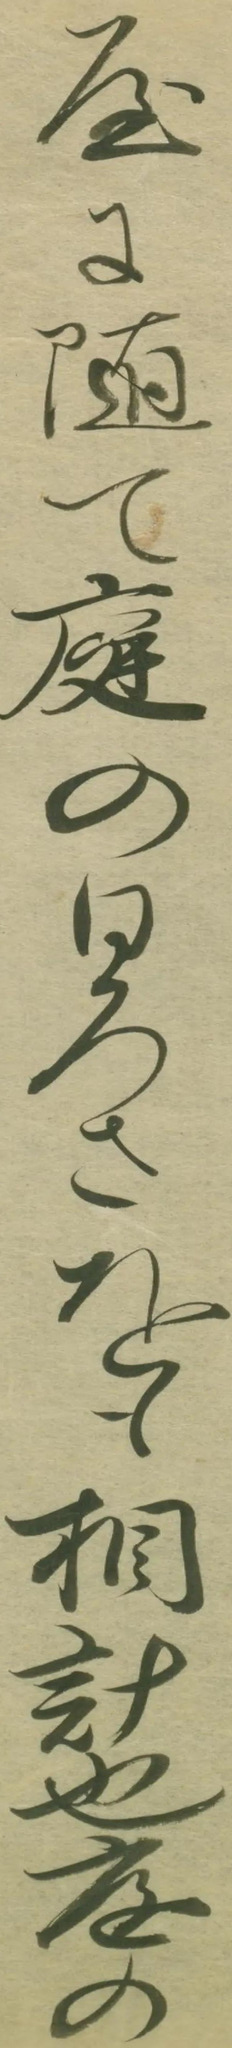屋に随て庭のひろさをも相計也庭の
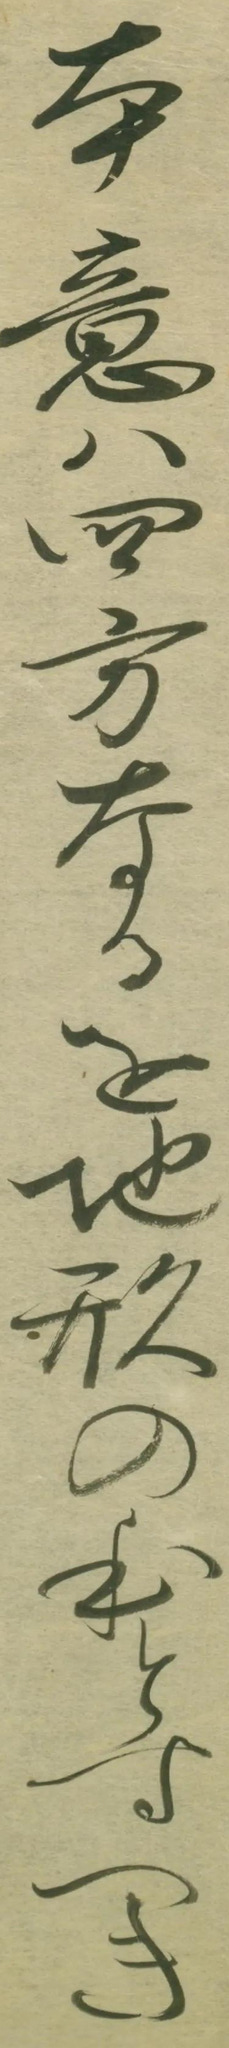本意は四方なるを地形の本とすへき
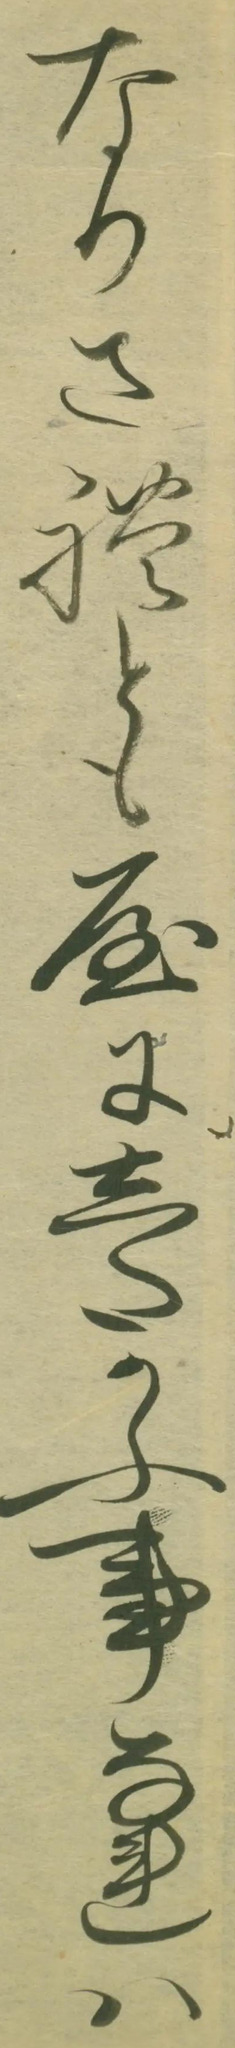なりされとも屋にしたかふ事なれは
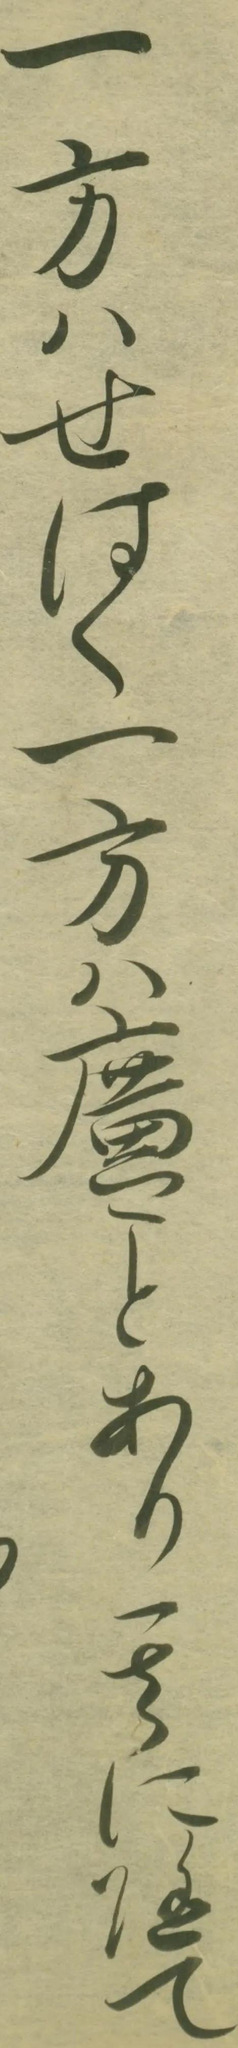一方はせはく一方は広とあり其に随て
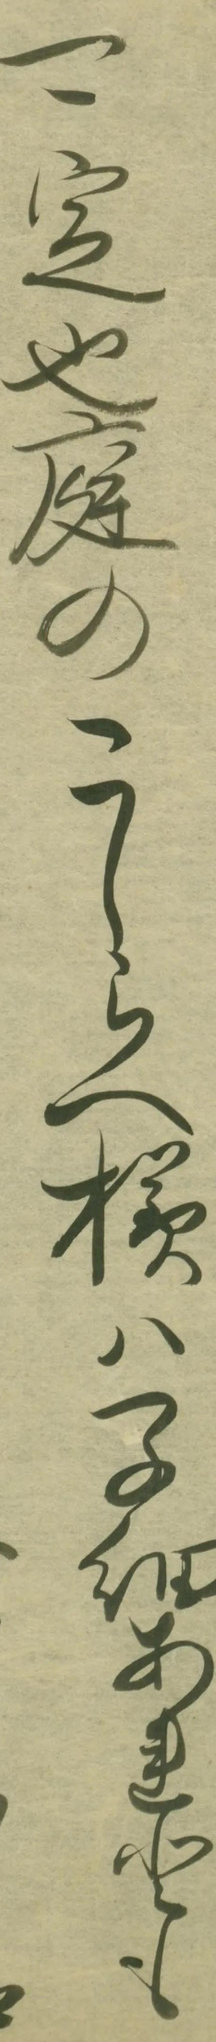可定也庭のこしらへ様は子細あれとも
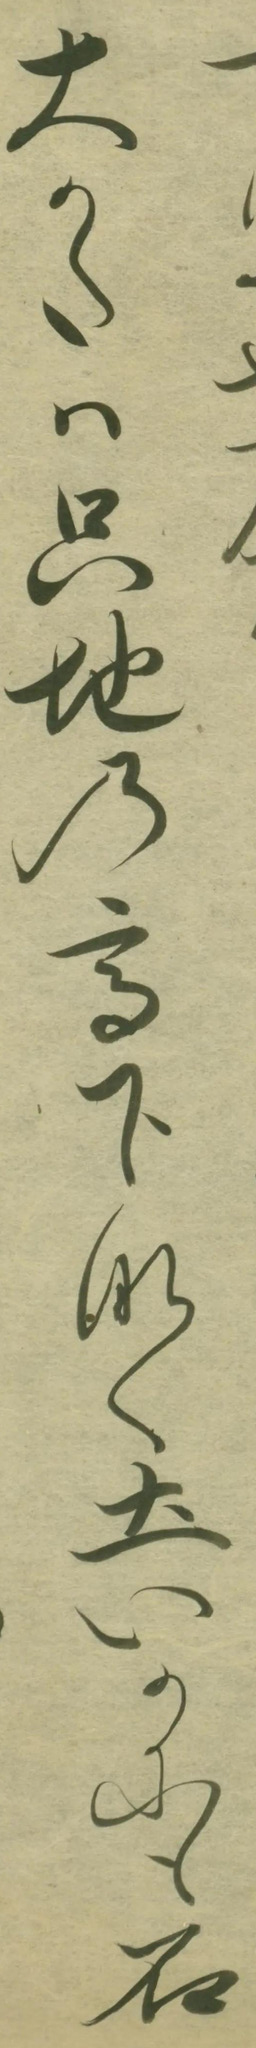大かたは只地の高下なく土いかにも石
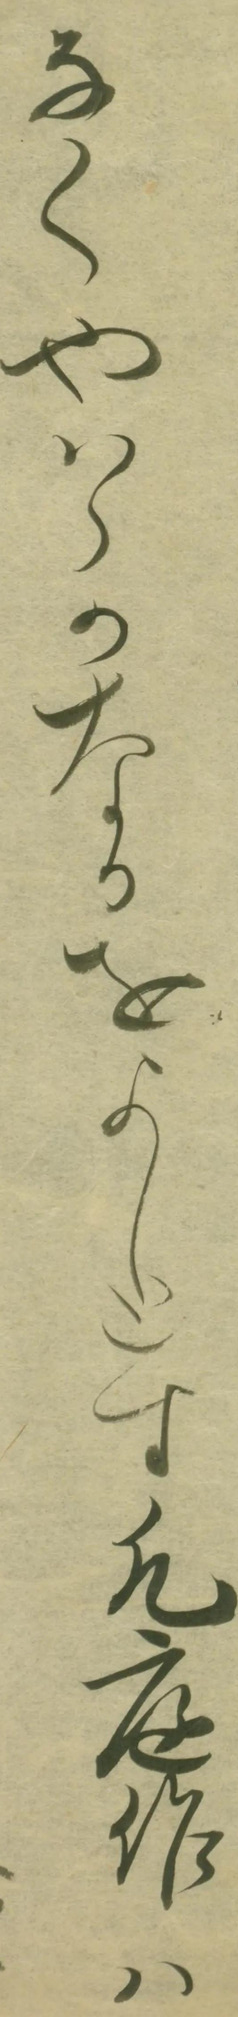なくやはらかなるをよしとす凡庭作は
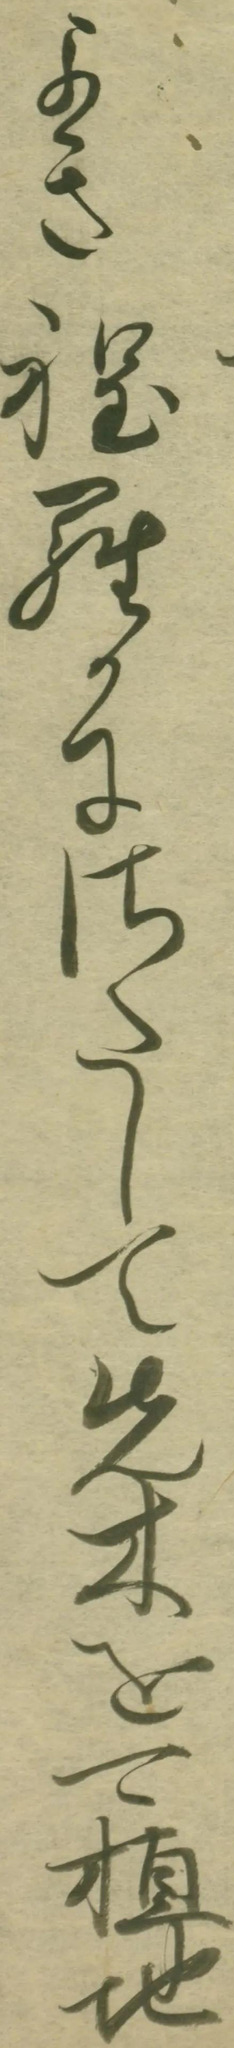よき程らひにさたして先木を可植地
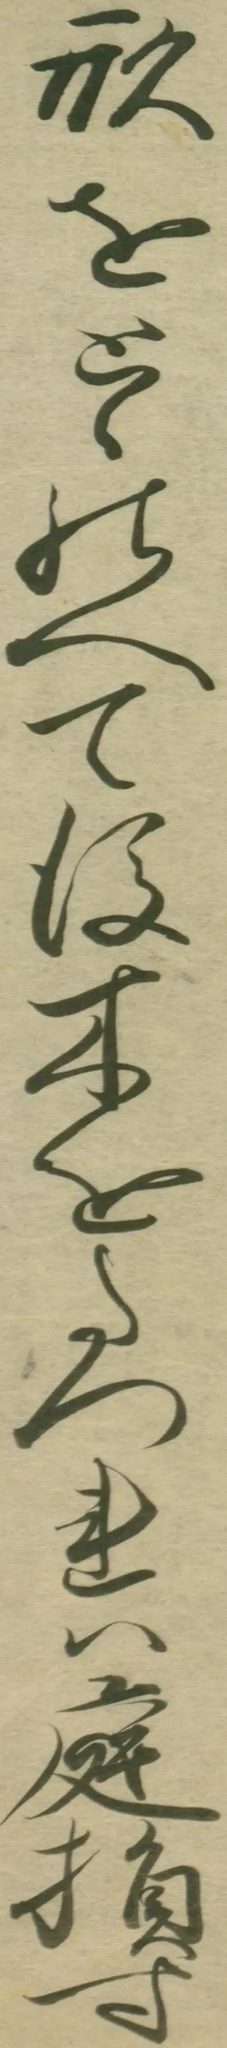形をとゝのへて後木をたつれは庭損す
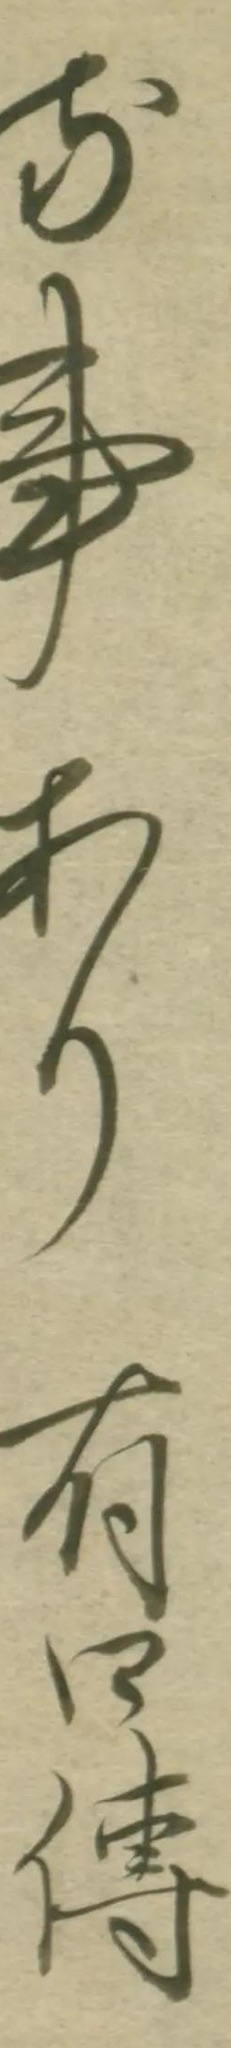る事あり有口伝
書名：蹴鞠之条々大概
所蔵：国立国会図書館 National Diet Library, JAPAN
